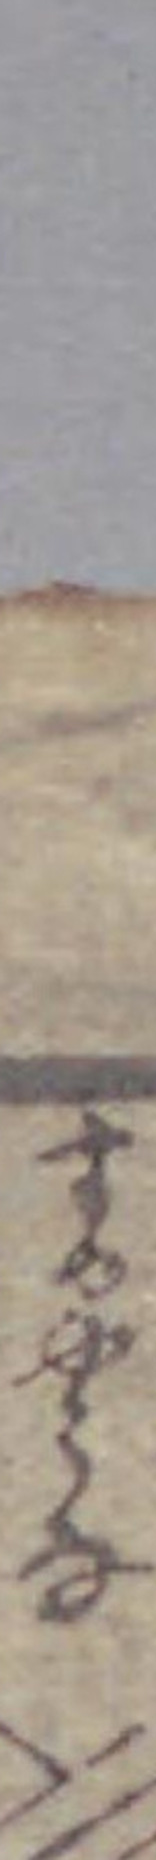するやうな
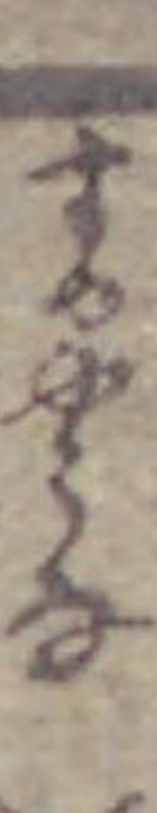するやうな
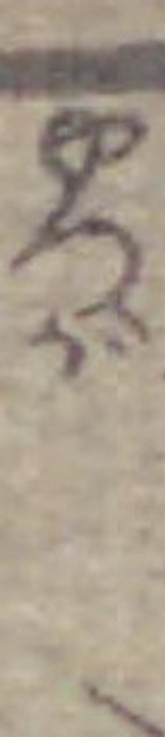やつが
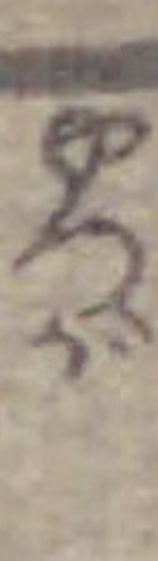やつが
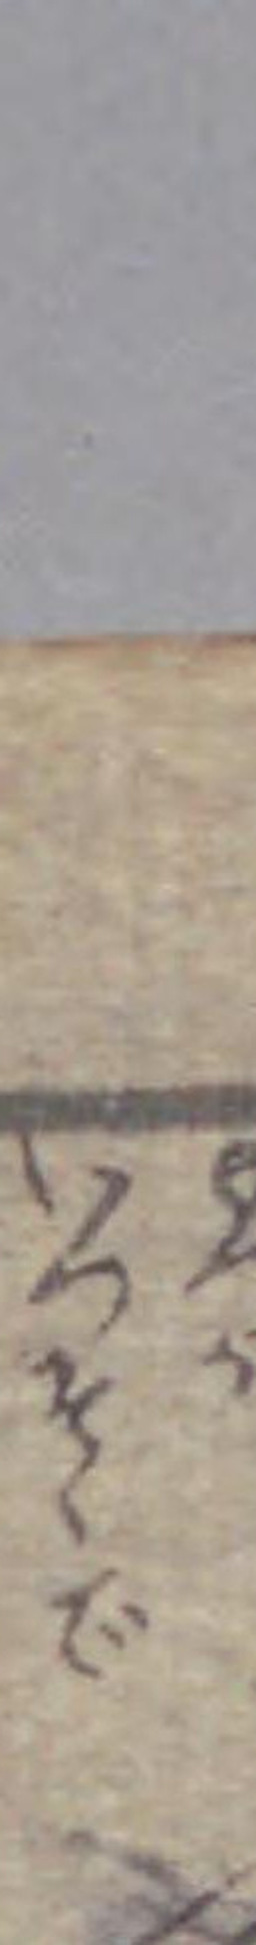いつそくで
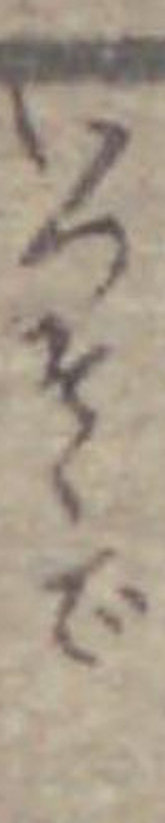いつそくで
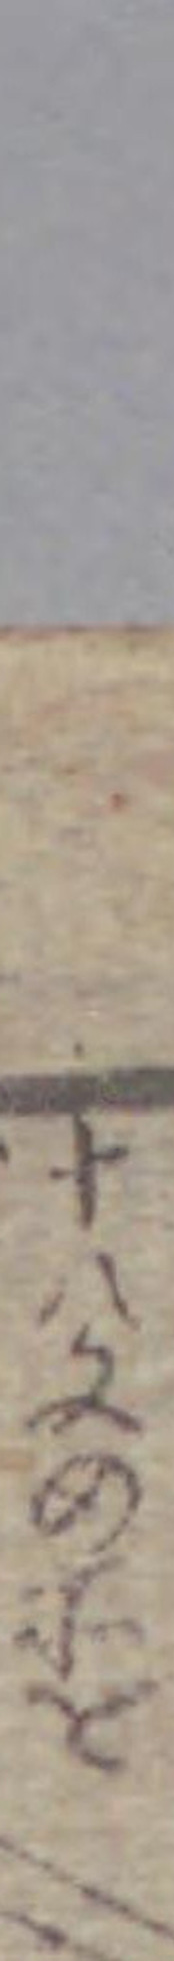十八文の所を
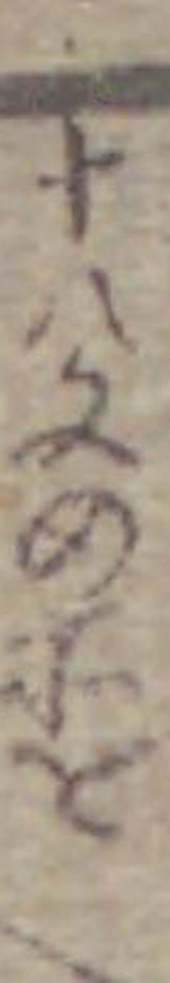十八文の所を
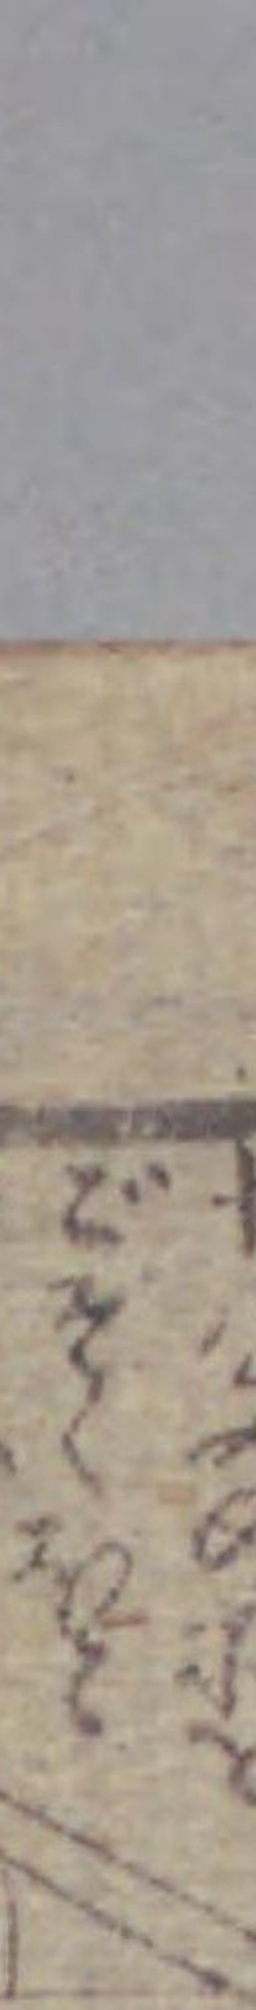ごそくほと
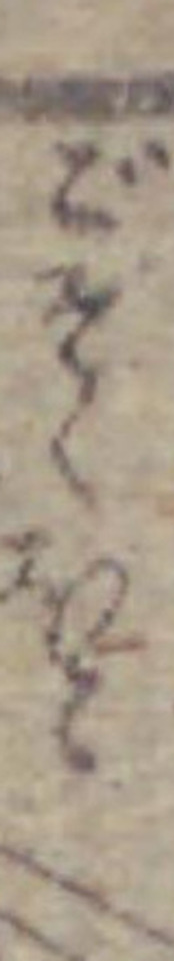ごそくほと
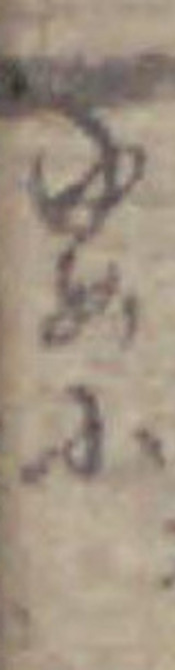ゆめに
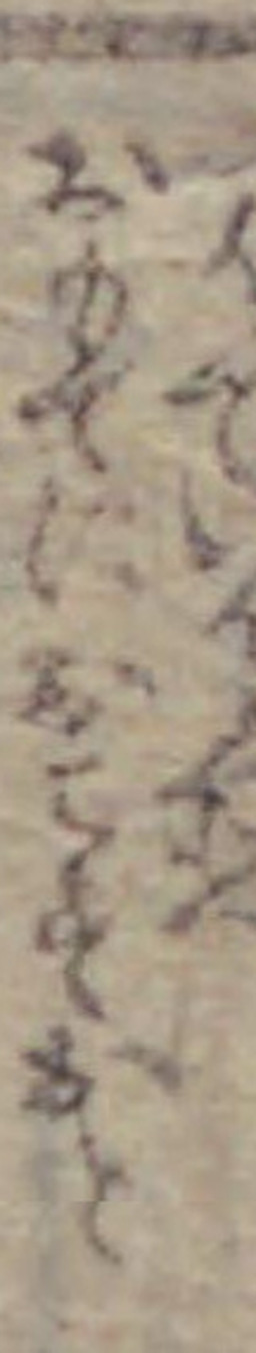おもてにおこすおと
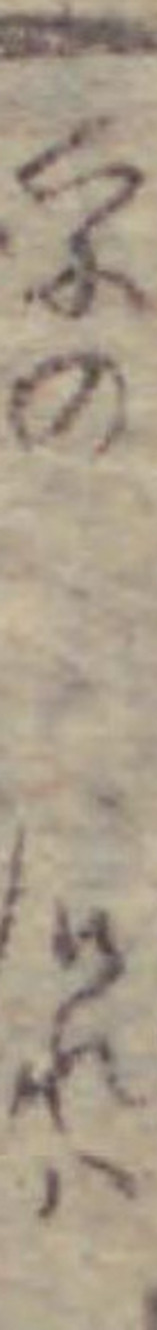くにの
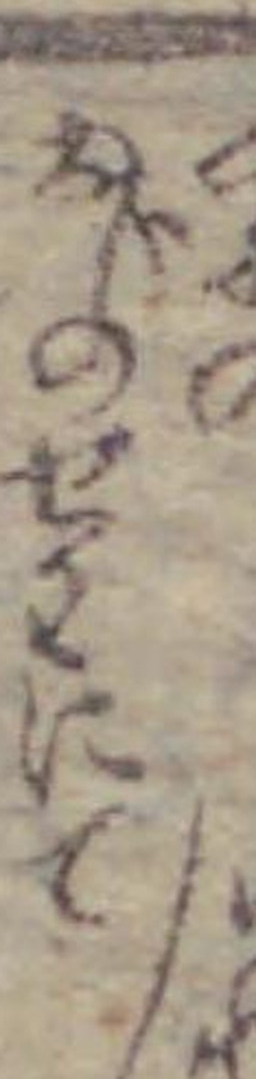おじのせわにて
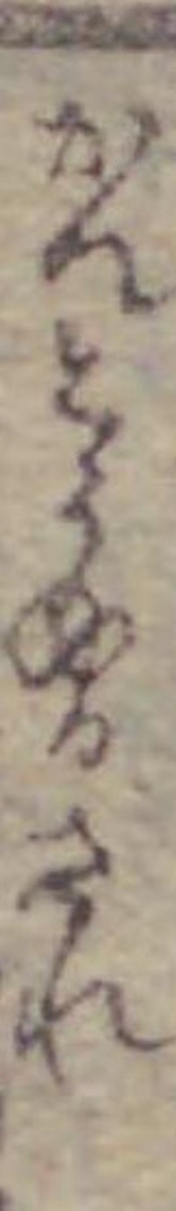かんとうゆるされしと
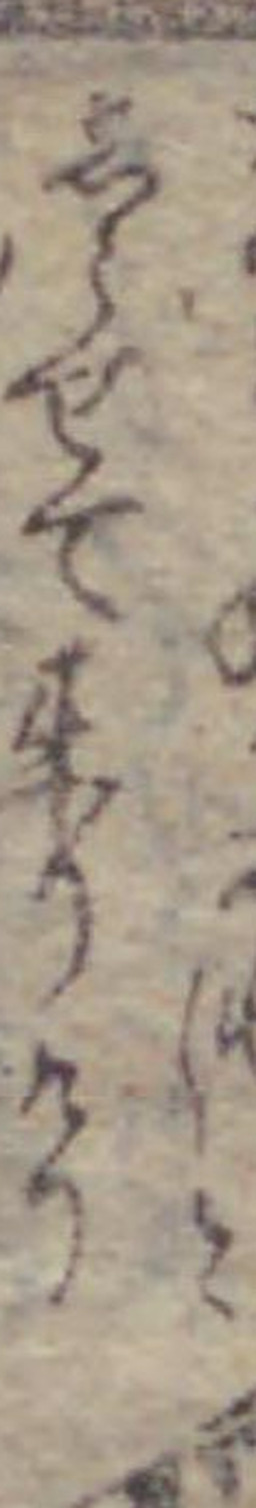しらせて来りけり
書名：見通占 : 3巻
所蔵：国立国会図書館 National Diet Library, JAPAN
